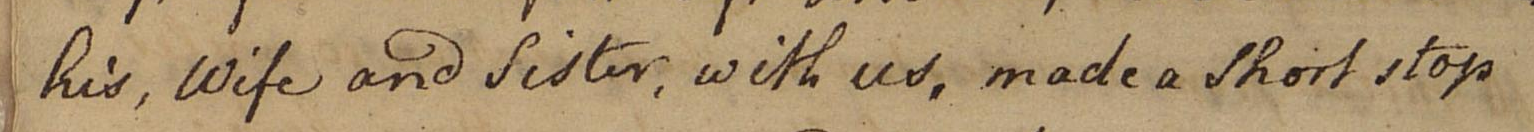his, Wife and Sister, with us, made a Short stop
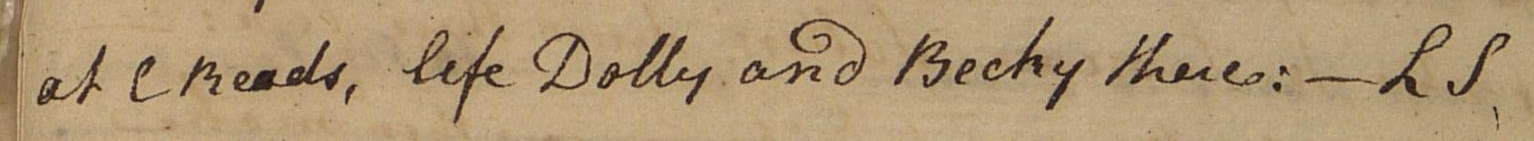at L Reads, life Dolly and Becky there:- L S
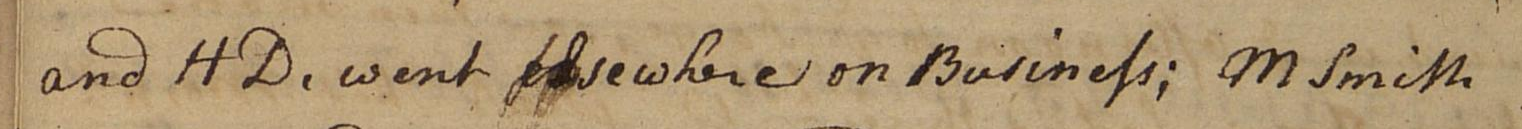and HD. went elsewhere on Business; M Smith
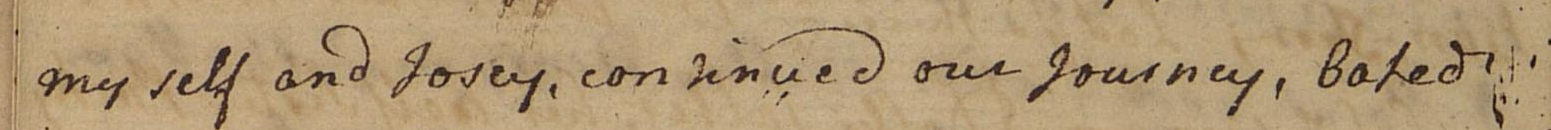my self and Josey, continued our Journey, bated
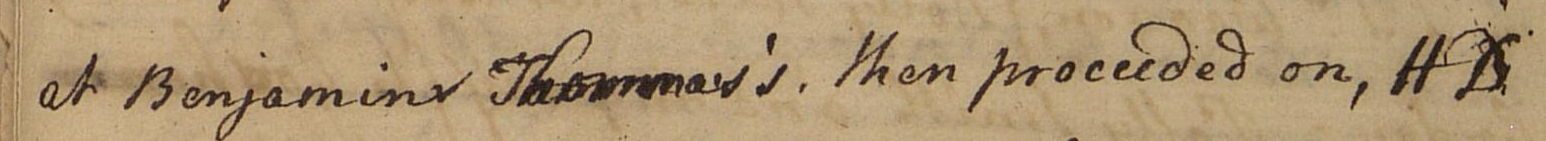at Benjamins Thommas's. then proceeded on, HD.
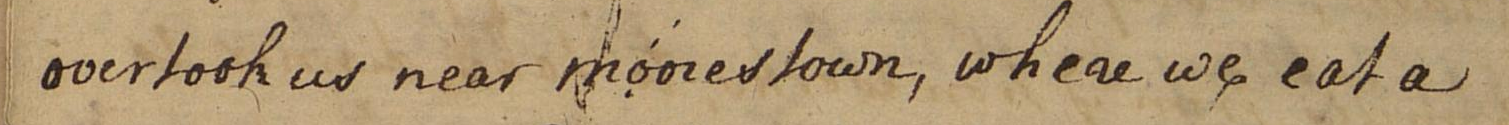overtook us near moorestown, where we eat a
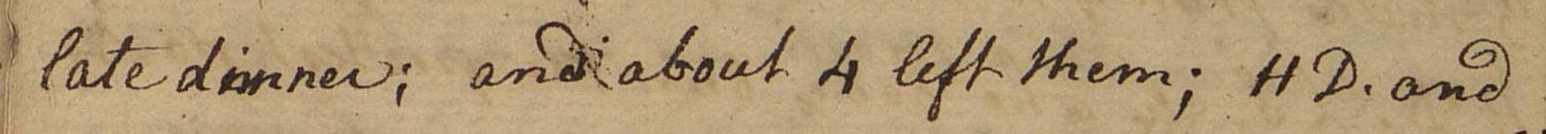late dimner; and about 4 left them; HD. and
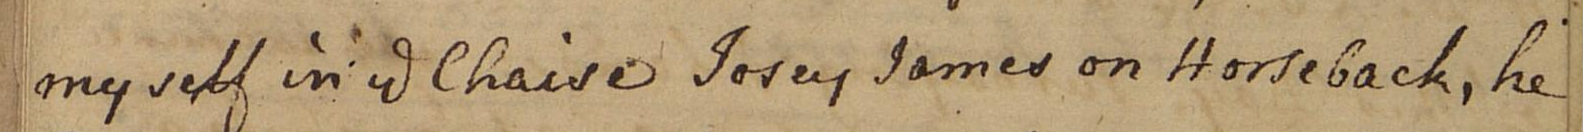my self in y^e Chaise Josey James on Horseback, he
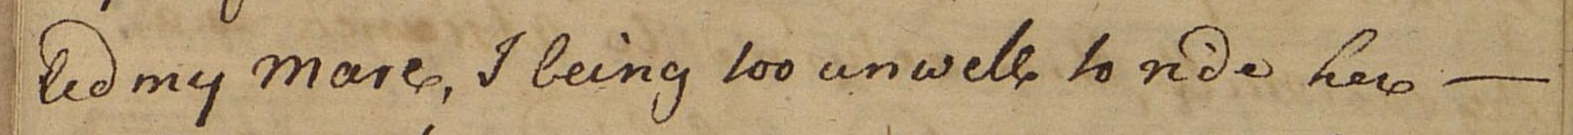led my mare, I being too unwell to ride her-
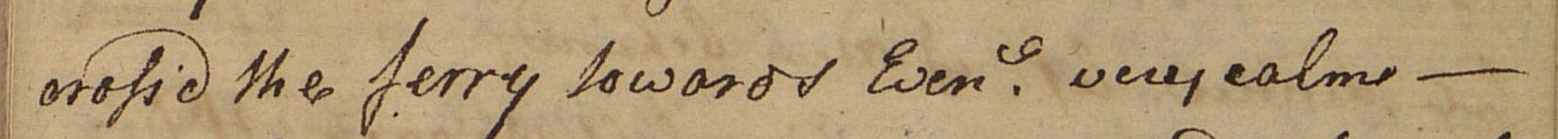cross'd the ferry towards Even^g. very calm-
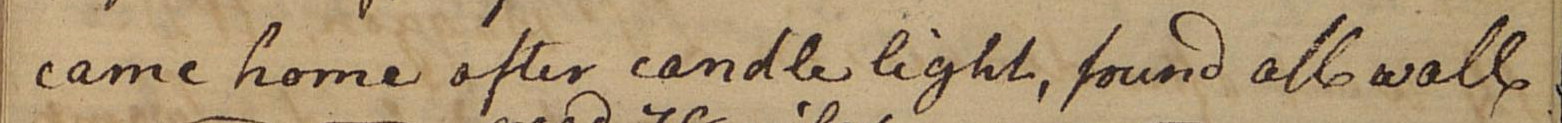came home after candle light, found all wall
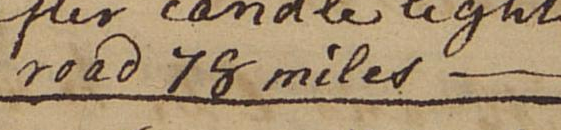road 78 miles-
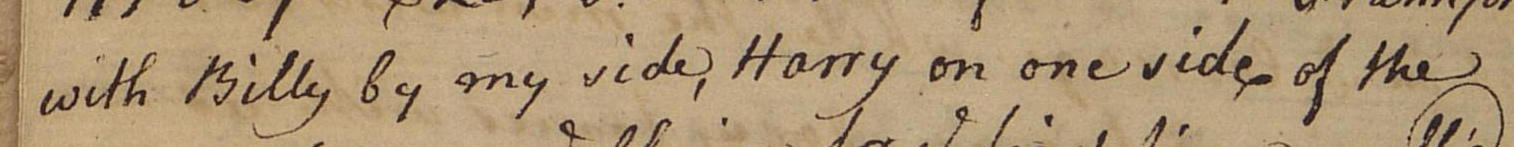with Billy by my side, Harry on one side of the
